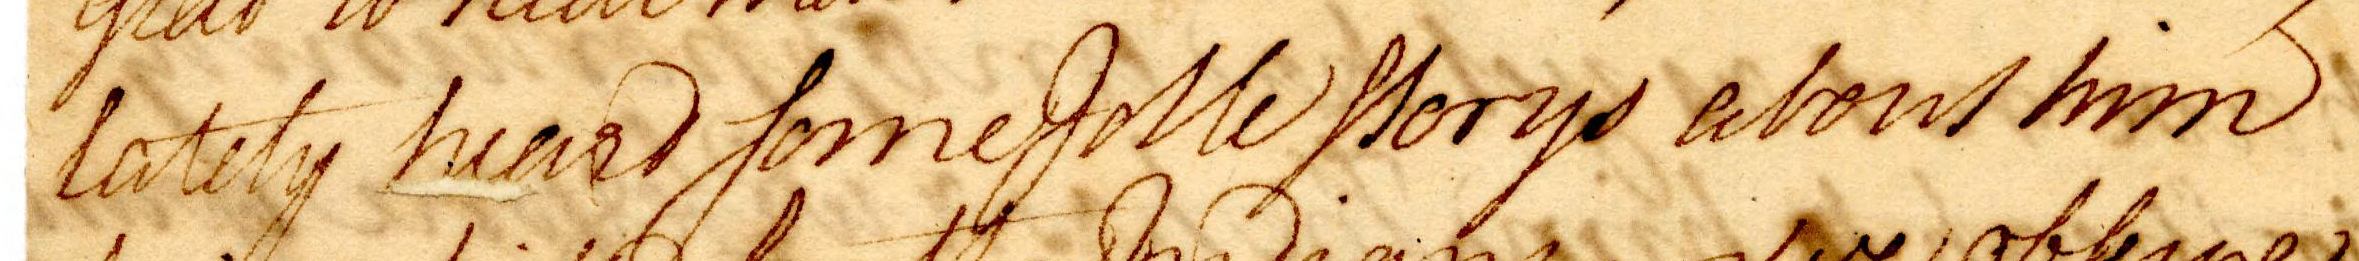latetly heard some Idle storys about him
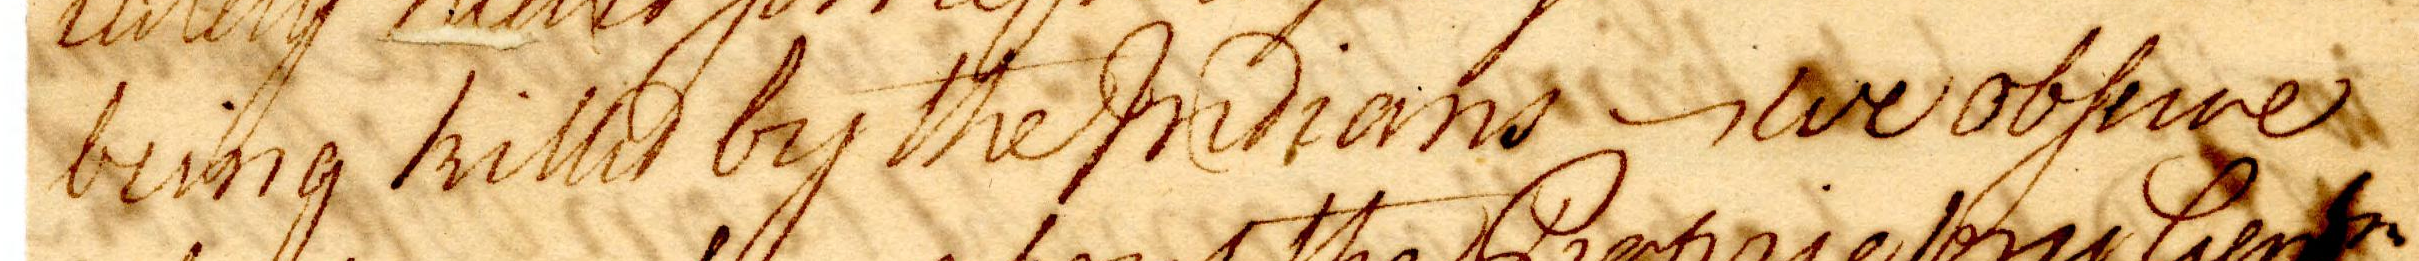being killed by the Indians- We observe
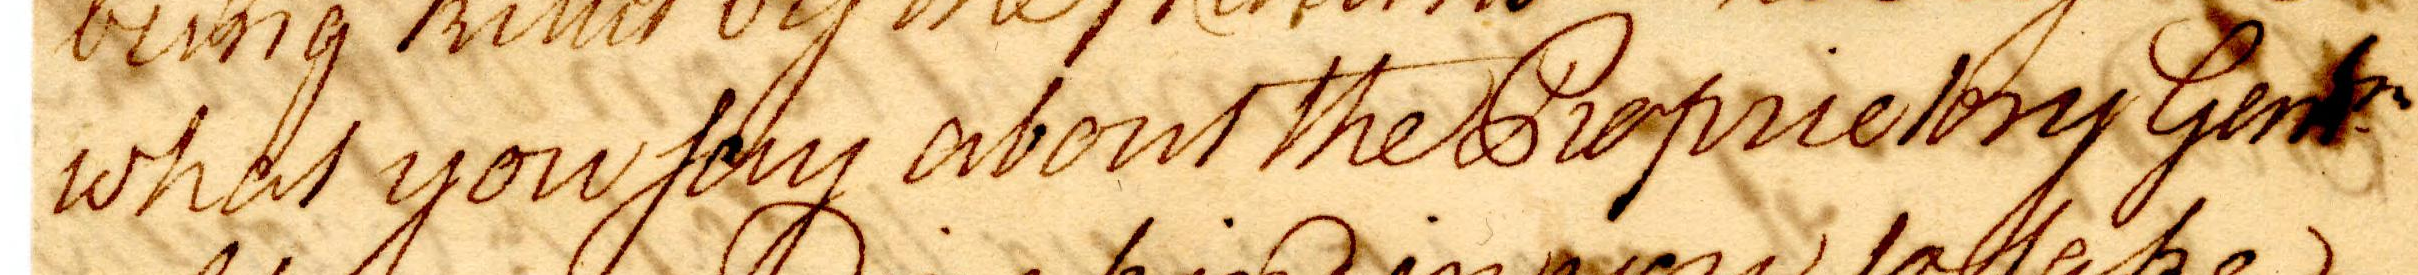what you say about the Proprietory Gent^n.
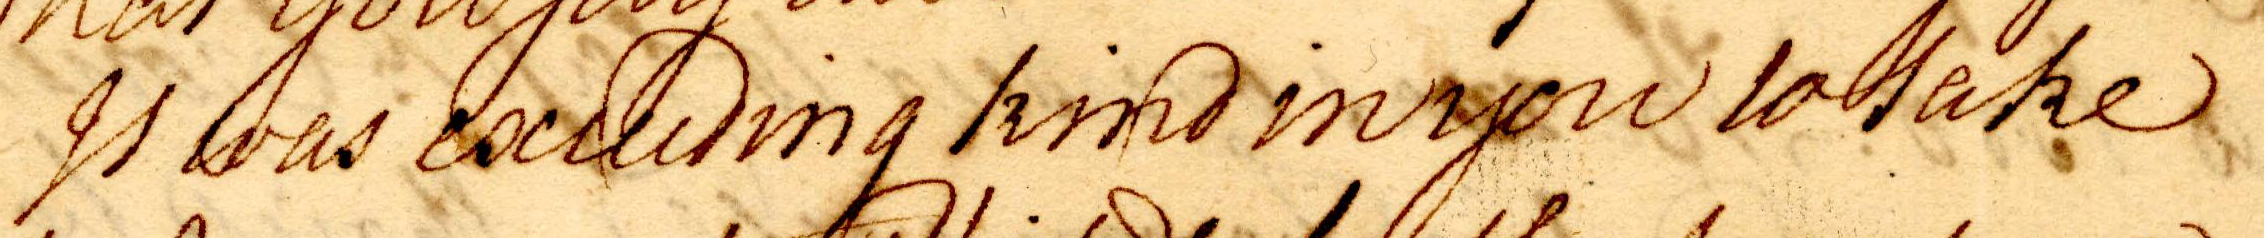It was Exceeding kind in you to take
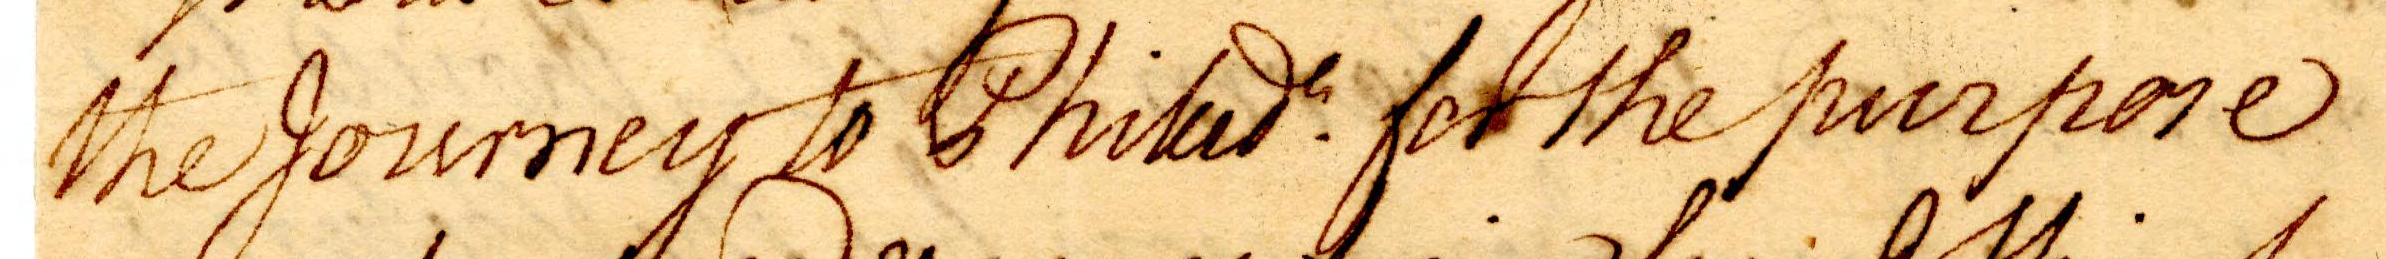the journey to Philad^a. for the purpose
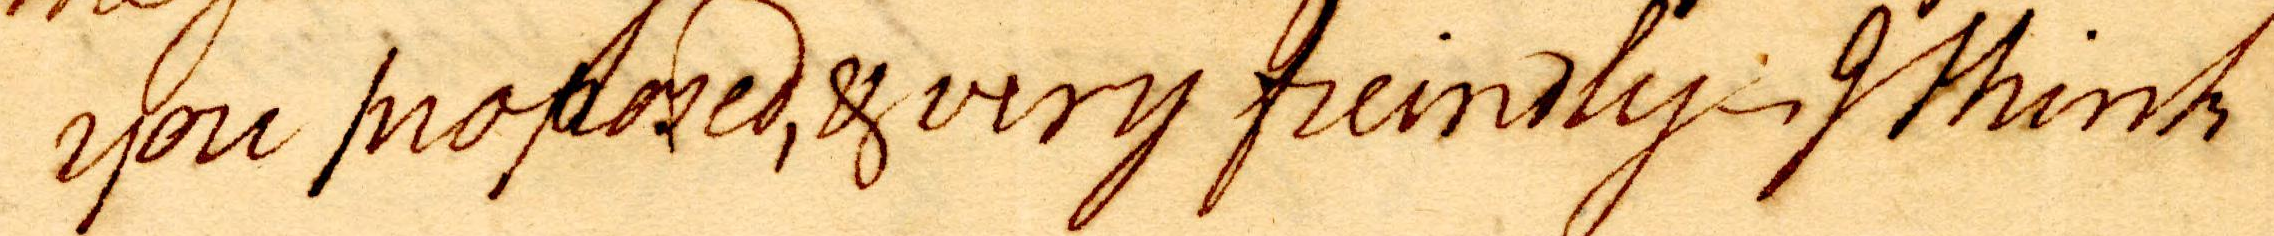you proposed, & very friendly- I think
